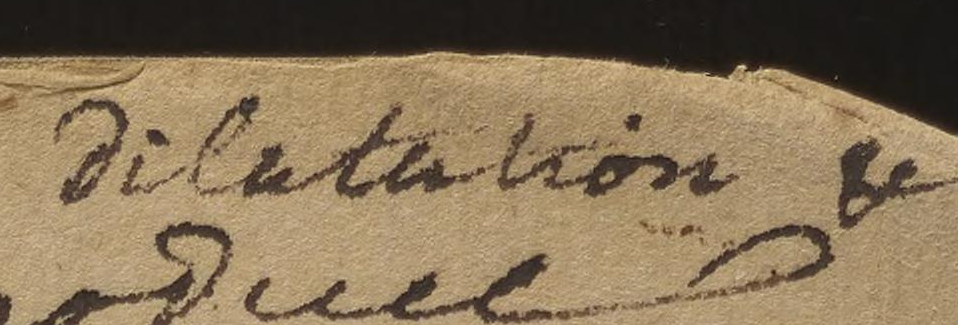dilation &
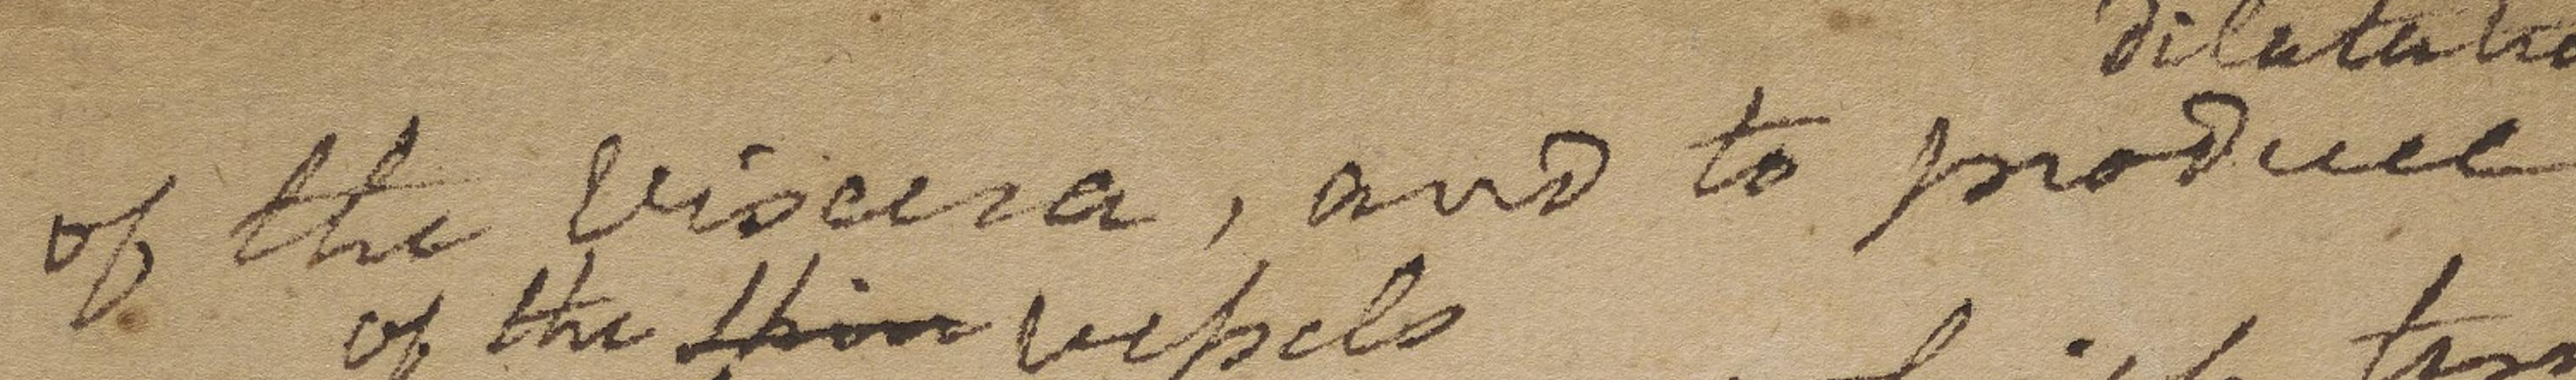of the viscera, and the produce ^
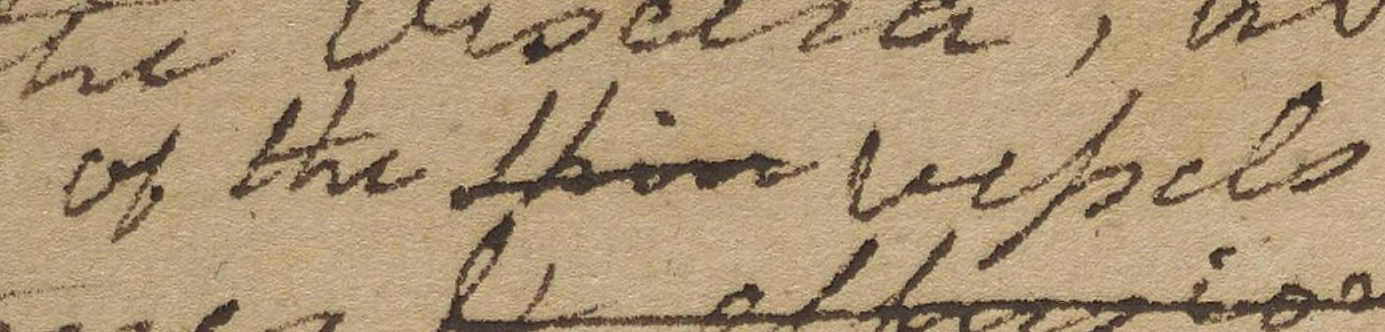of the [skin] vessels
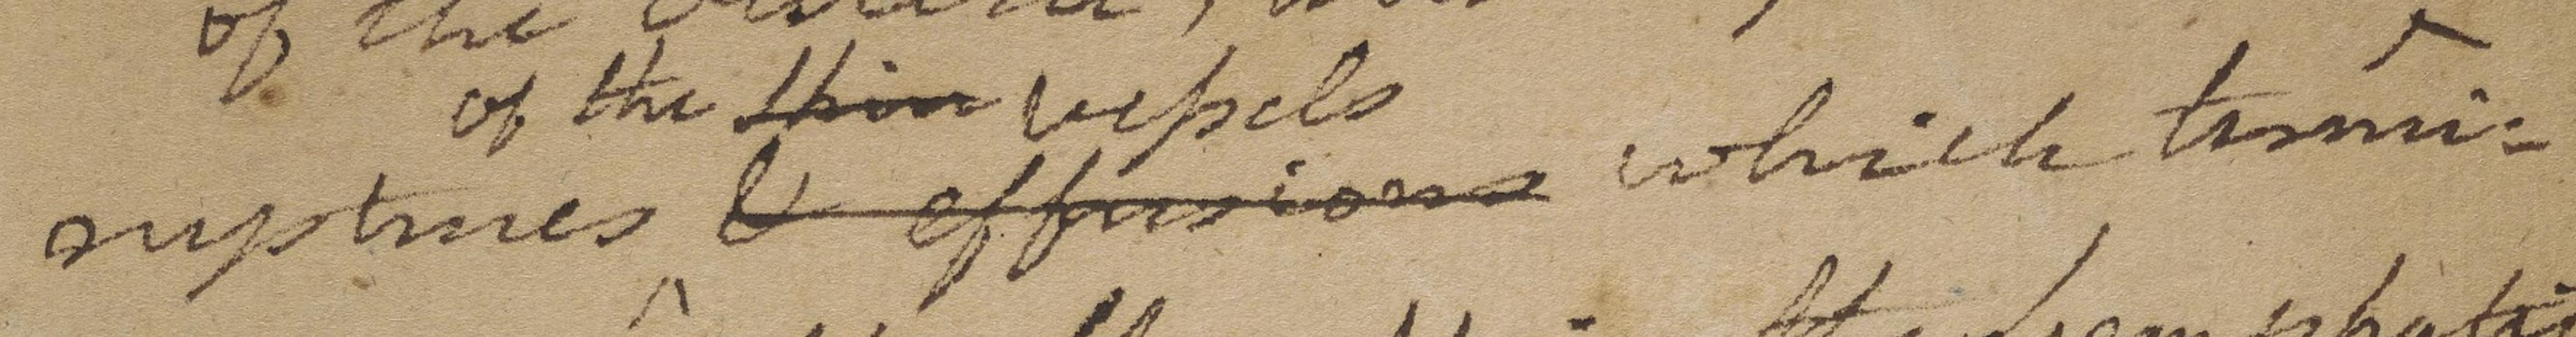systems ^ [& effusions] which termi-
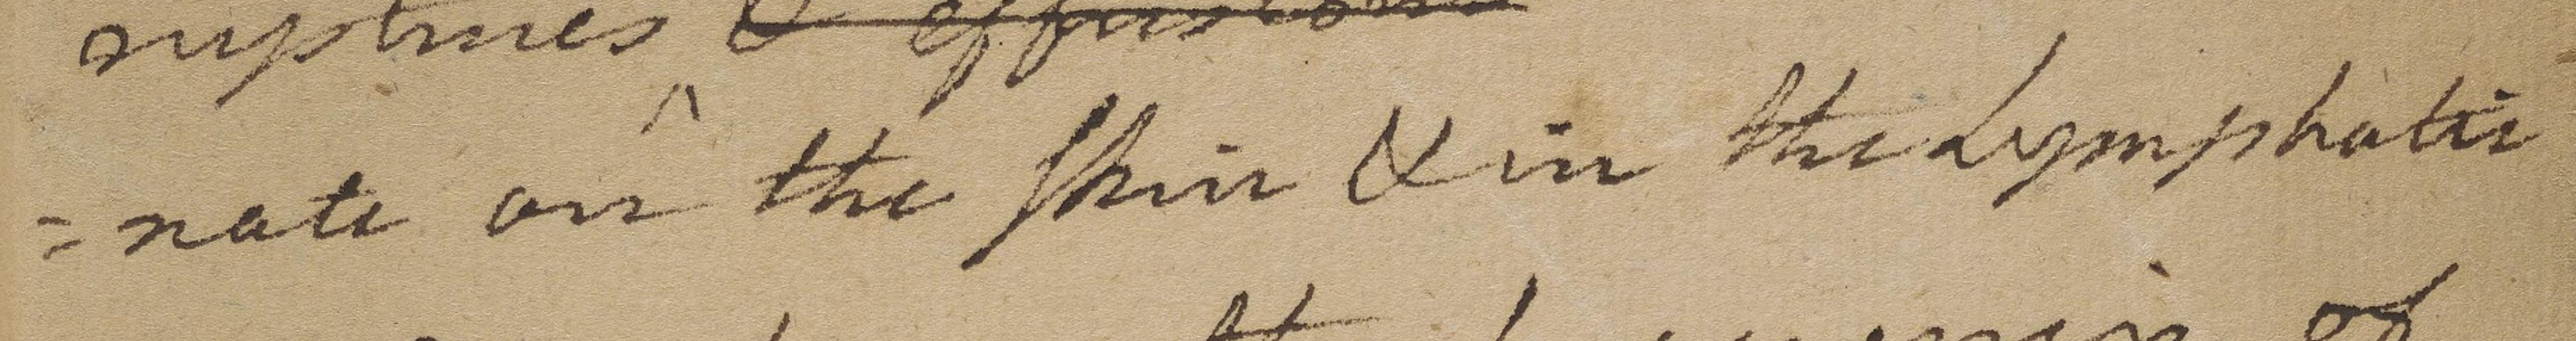-nate on the skin & in the Lymphatis
